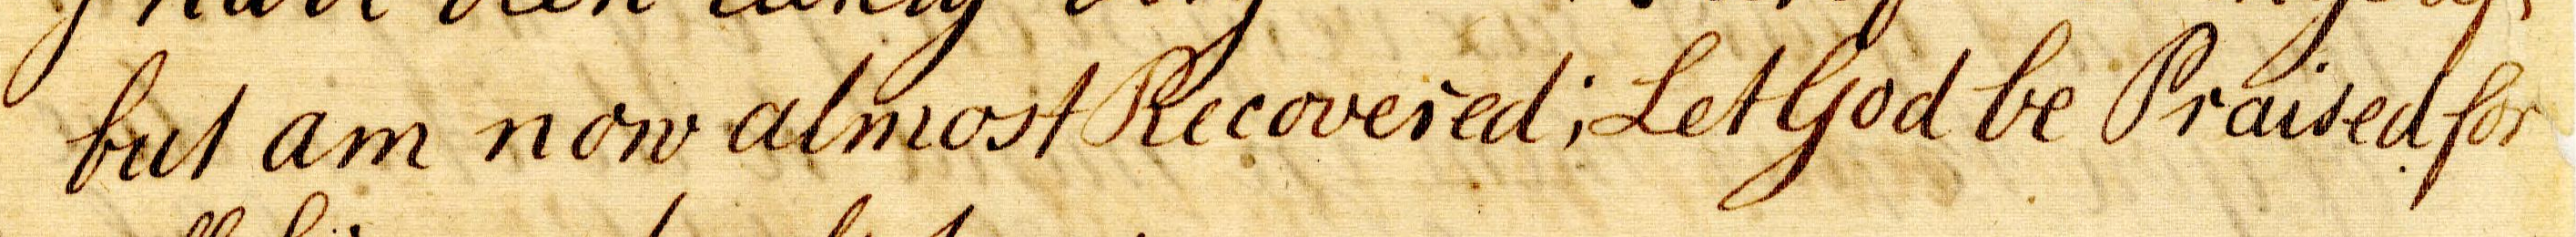but am now almost Recovered; Let God be Praised for
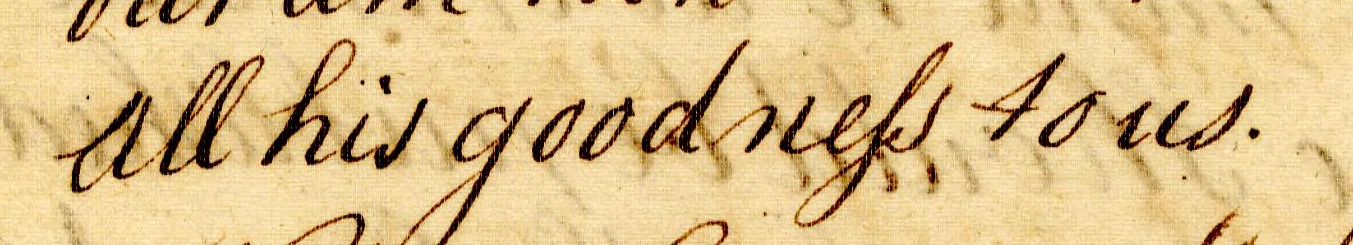All his goodness to us.
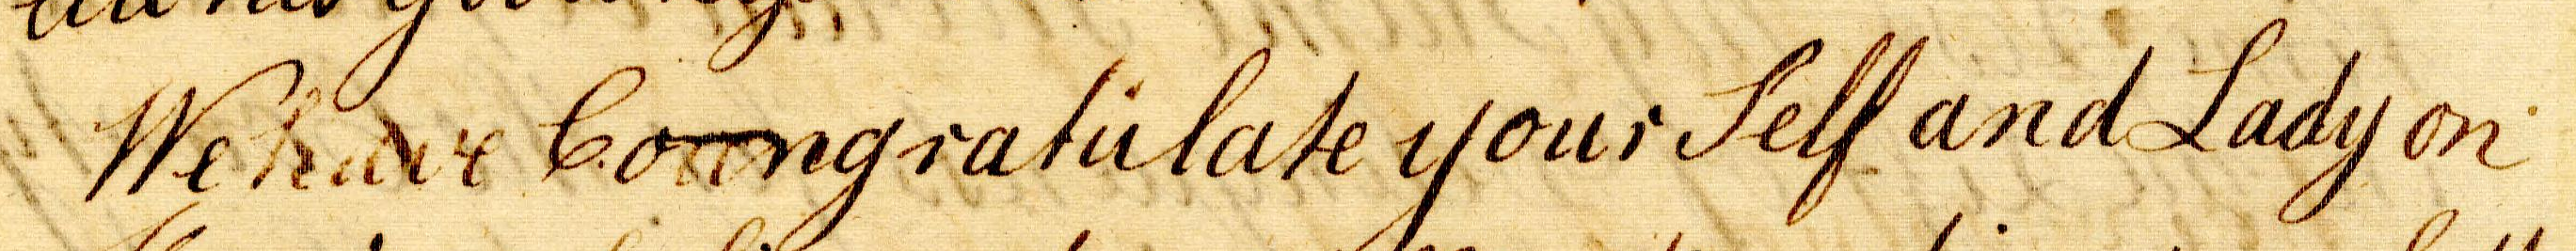We have Congratulate Your Self and Lady on
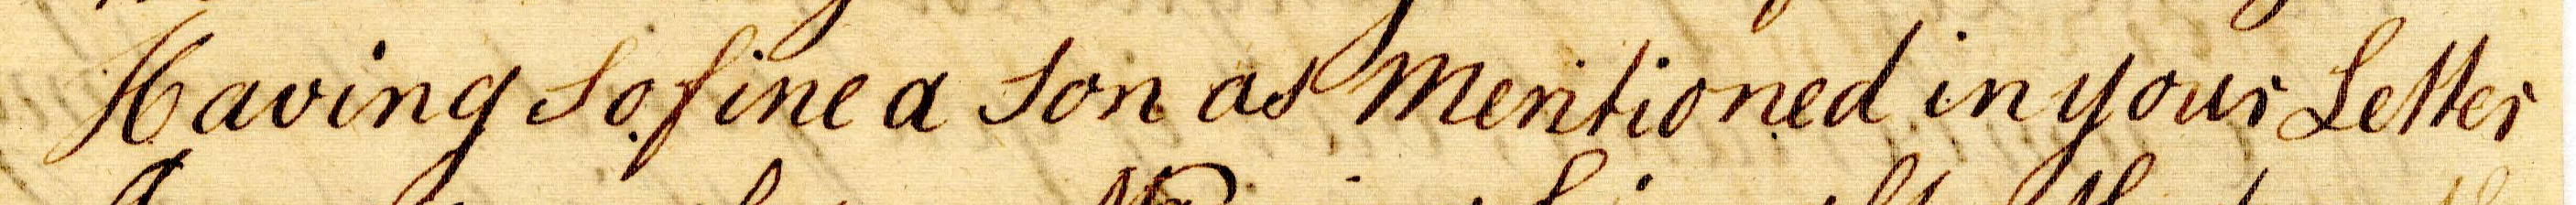Having So fine a son as Mentioned in Your Letter,
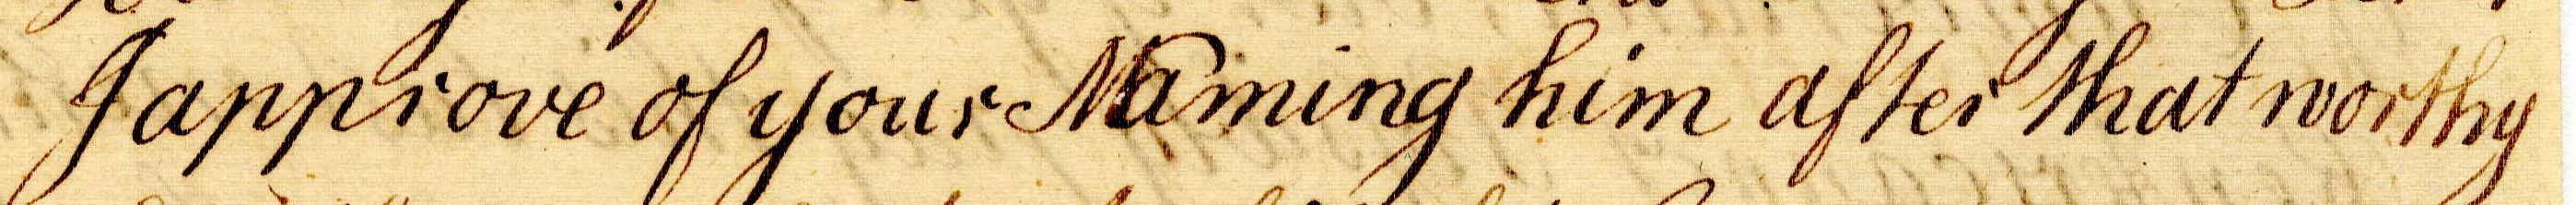I approve of Your Naming him after that worthy
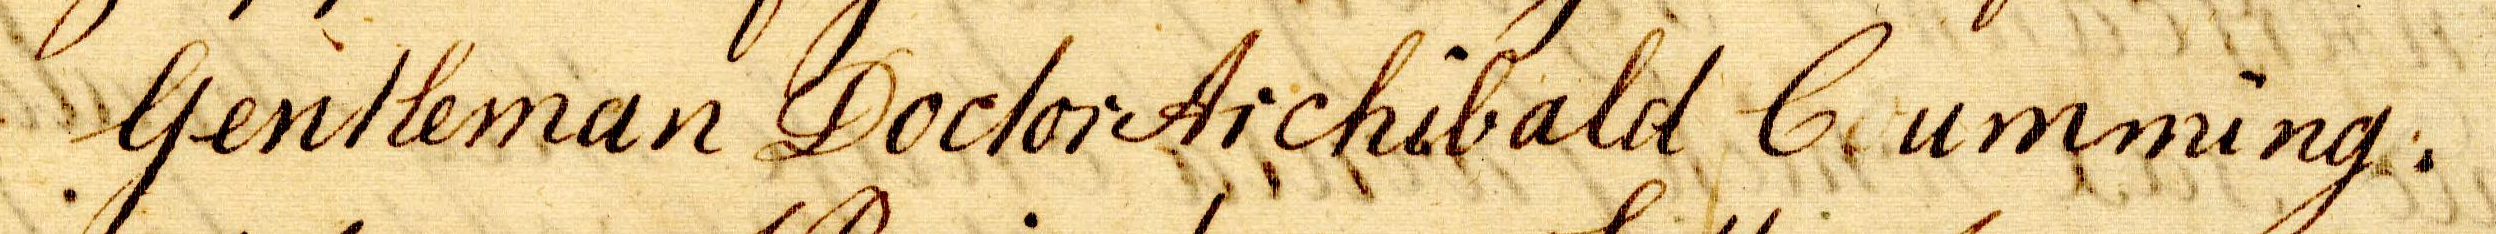Gentleman Doctor Archibald Cumming.
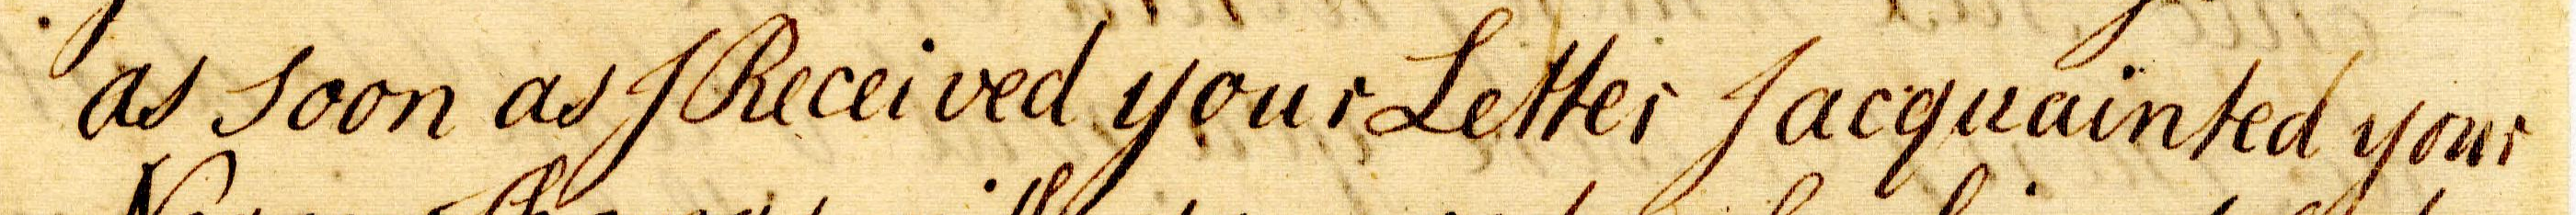As soon as I Received Your Letter I acquainted your
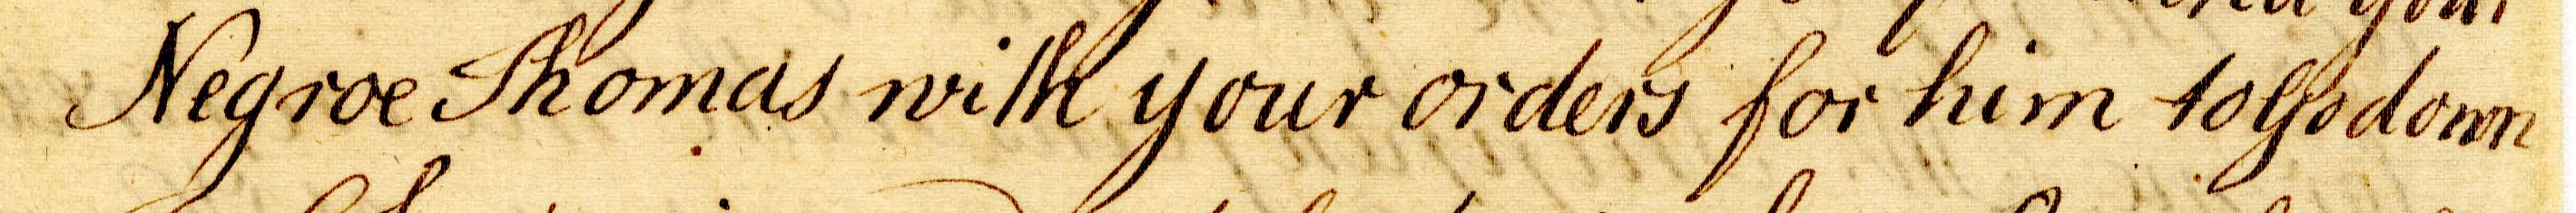Negroe Thomas with Your orders for him to Go down
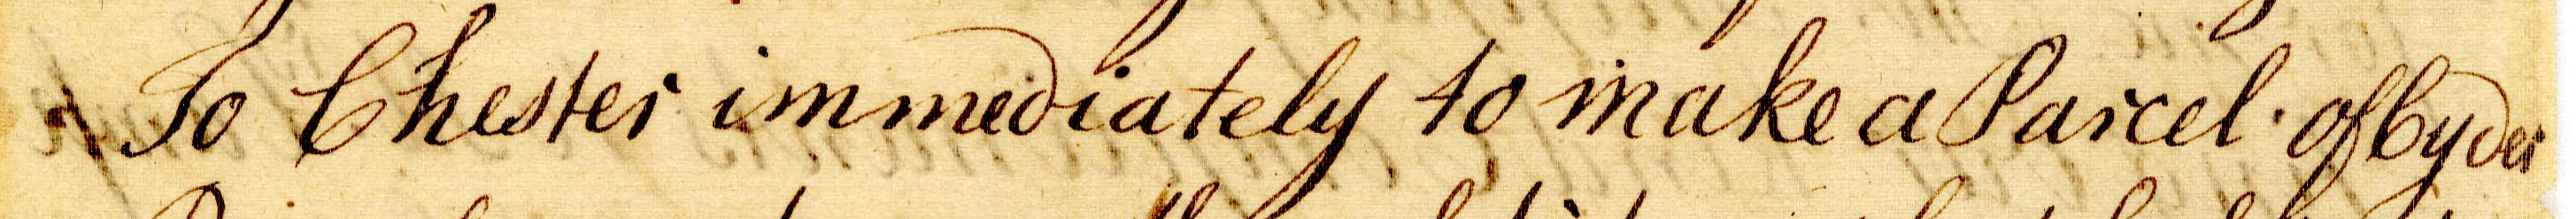To Chester immediately to make a Parcel of Cyder
